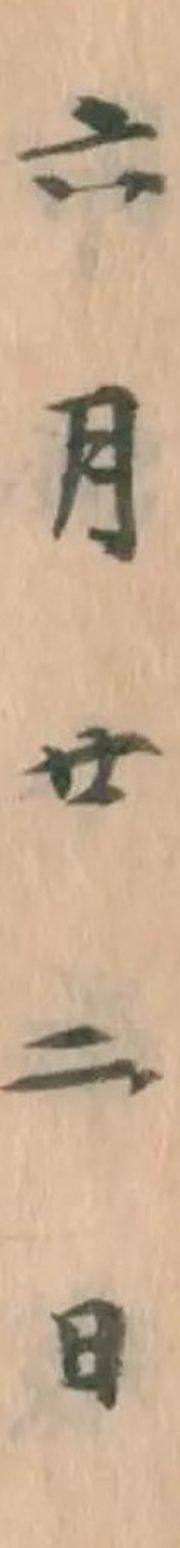六月廿二日
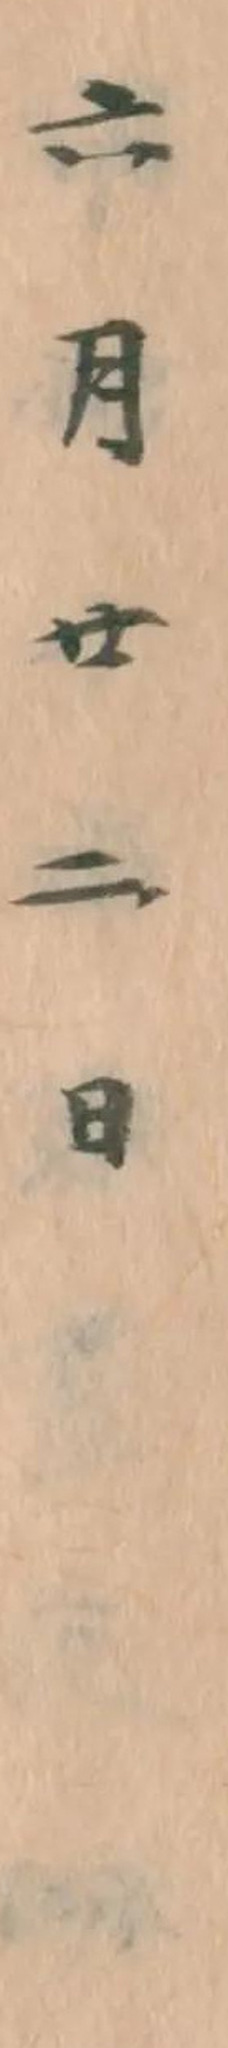六月廿二日
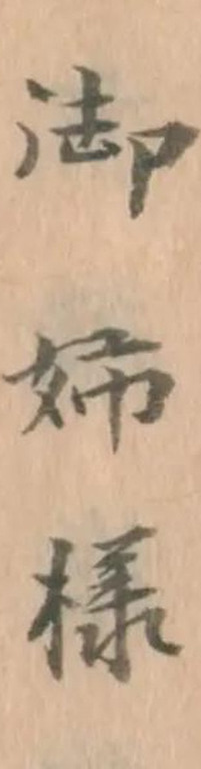御姉様

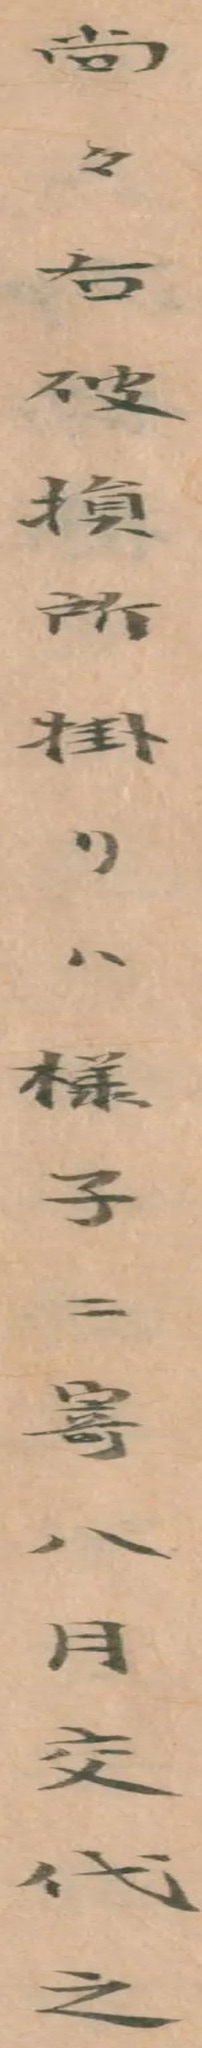尚々右破損所掛リハ様子二寄八月交代之
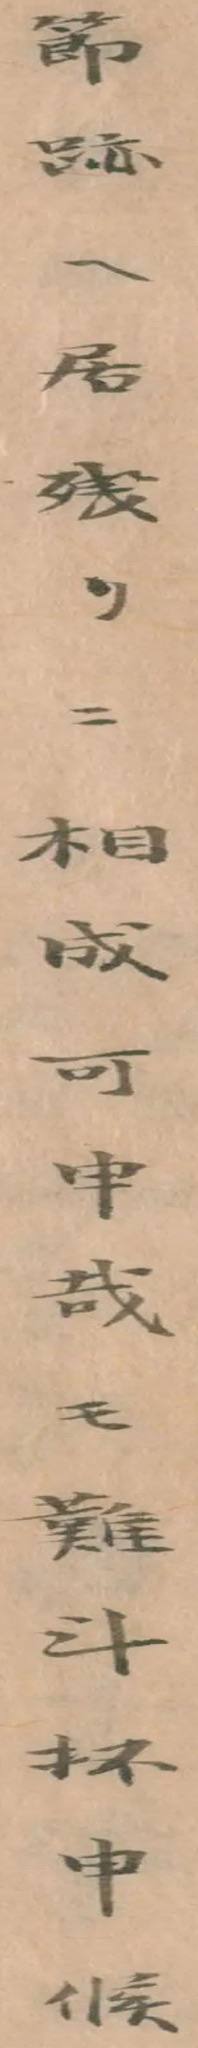節跡へ居残り二相成可申哉モ難斗抔申候
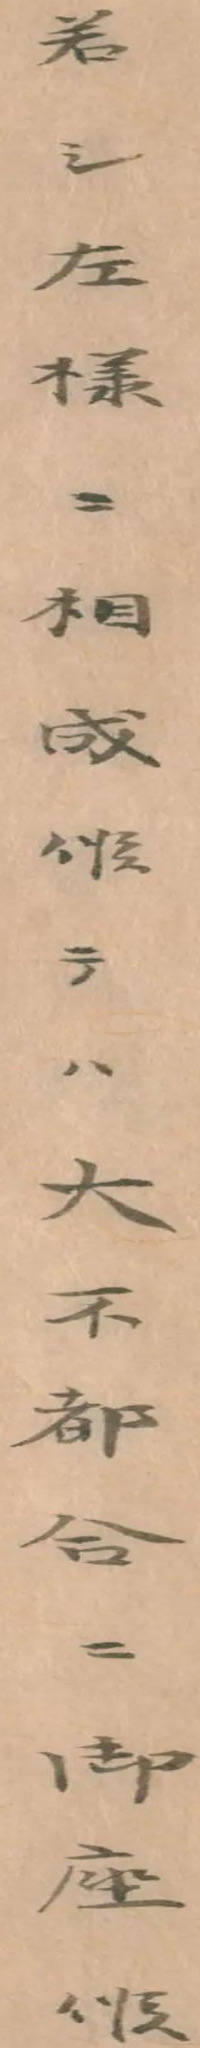若シ左様二相成候テハ大不都合二御座候
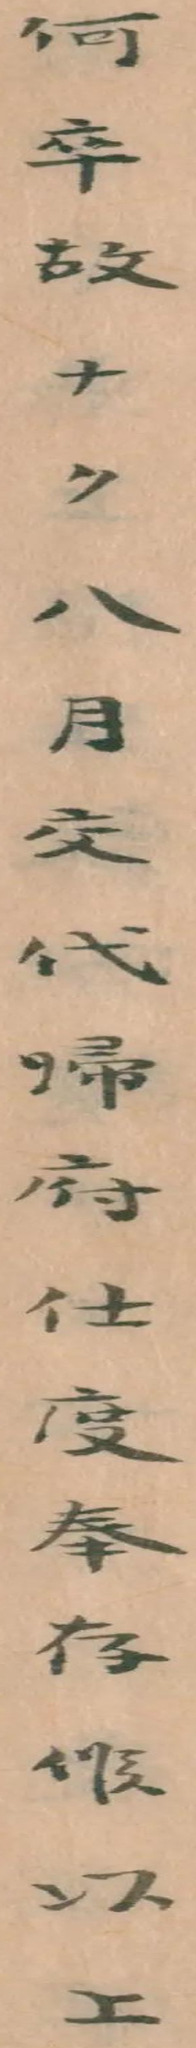何卒故ナク八月交代帰府仕度奉存候以上
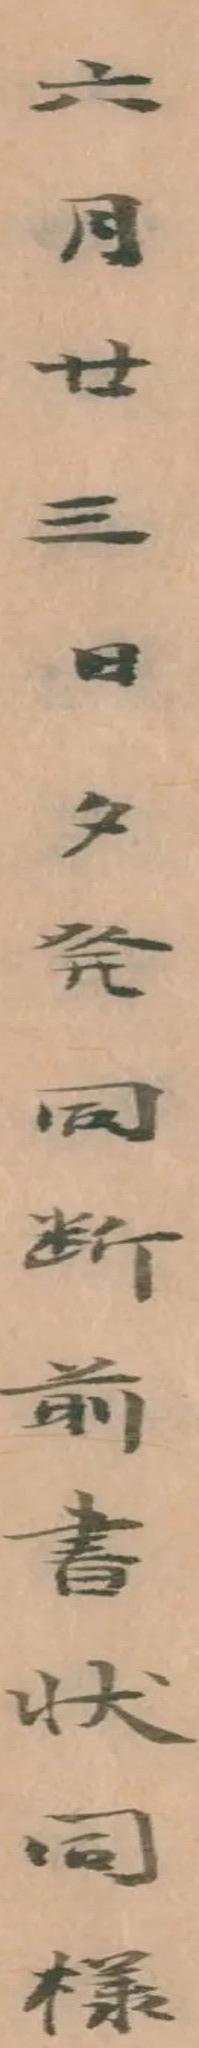六月廿三日夕発同断前書状同様
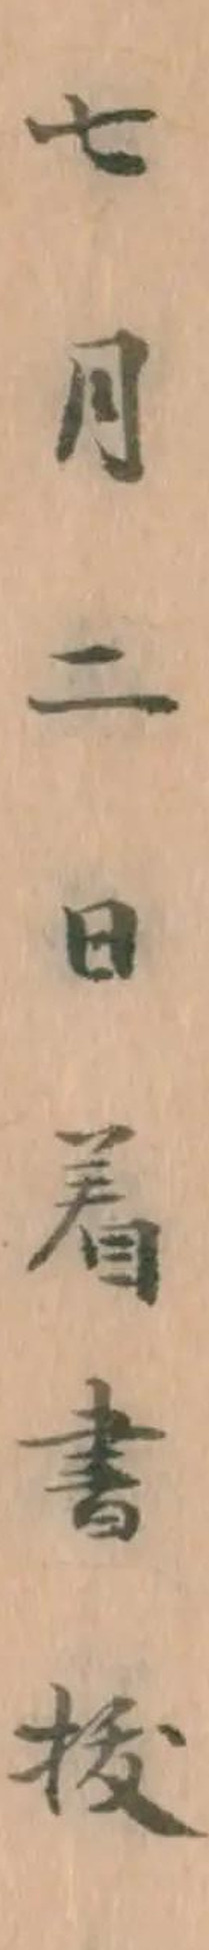七月二日着書抜
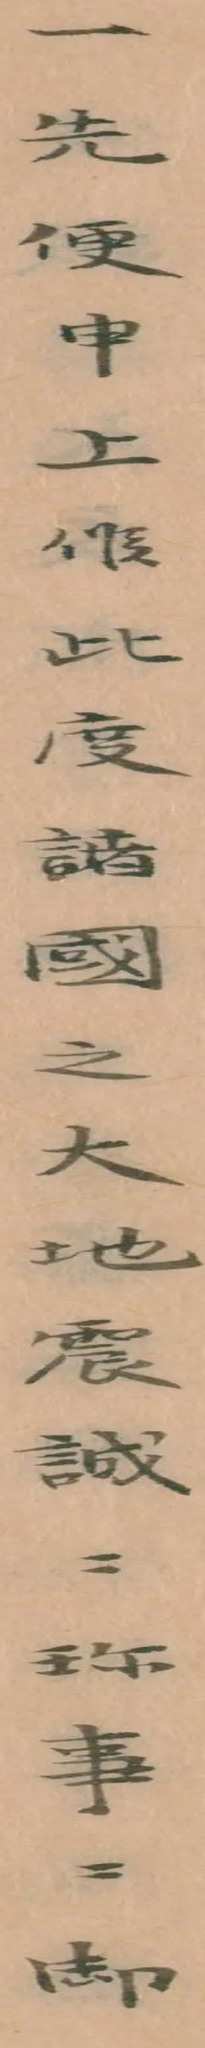一先便申上候此度諸国之大地震誠二珍事二御
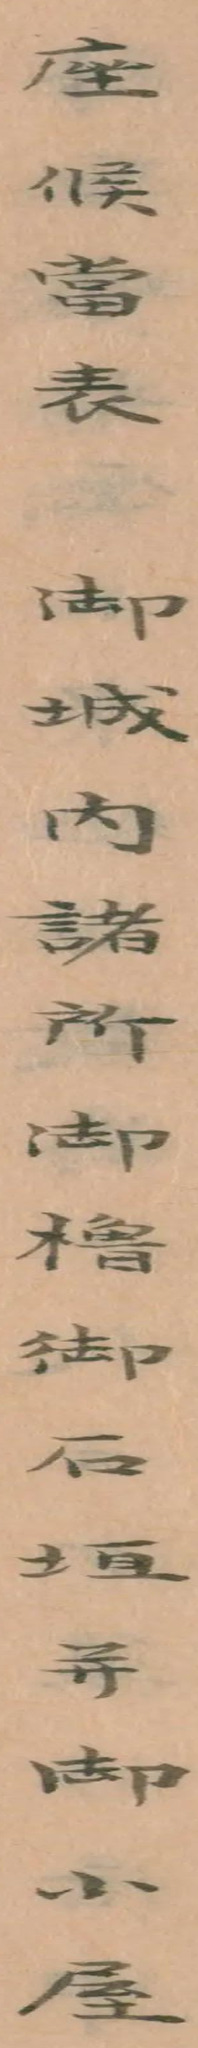座候当表御城内諸所御櫓御石垣并御小屋
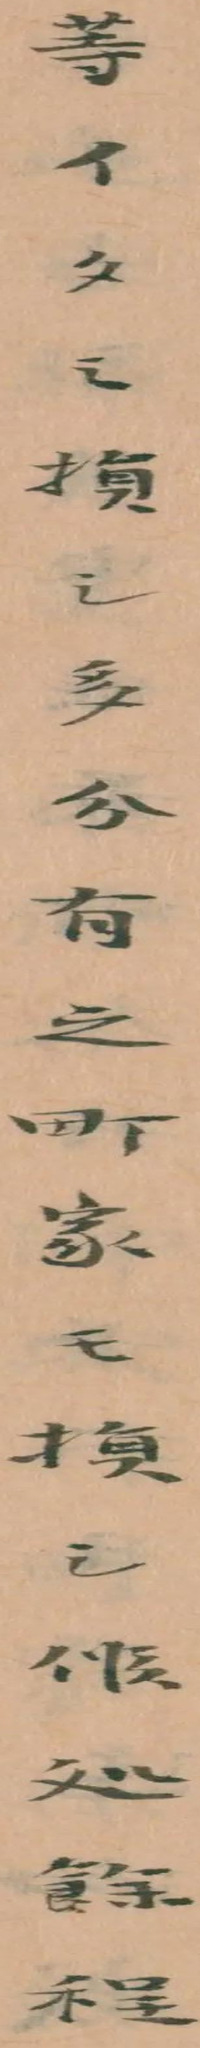等イタミ損シ多分有之町家モ損シ候処余程
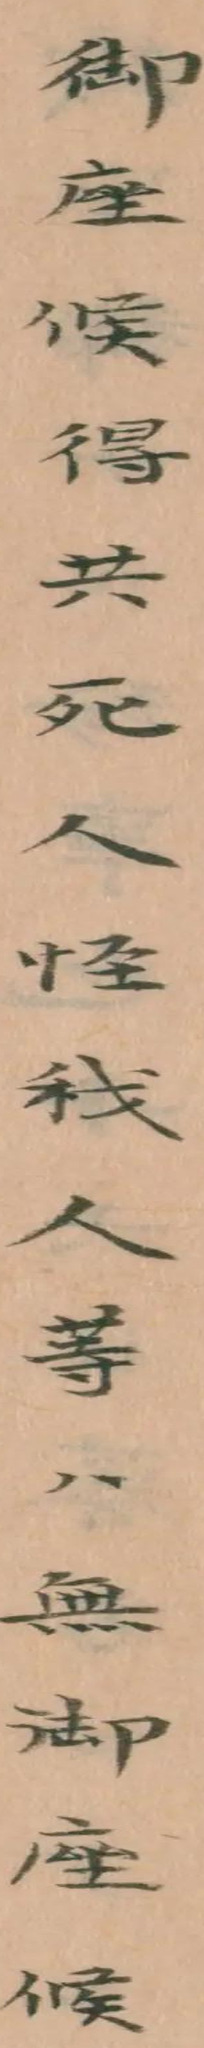御座候得共死人怪我人等ハ無御座候
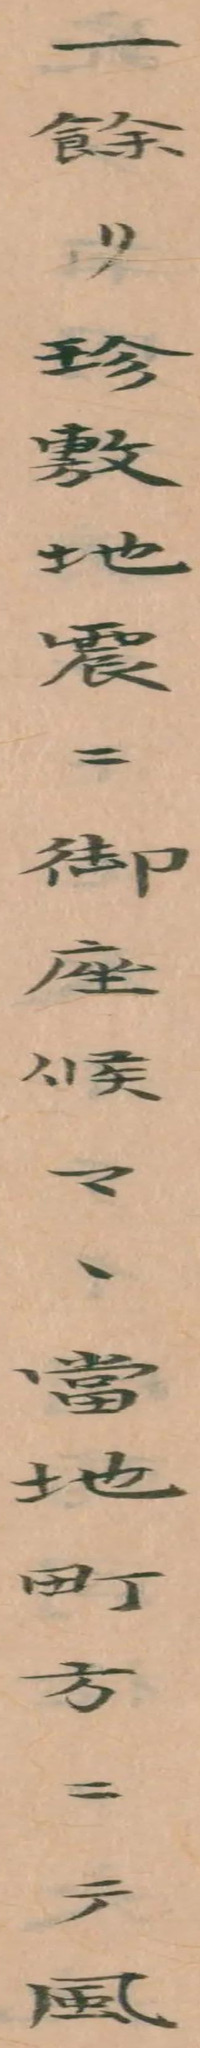一余り珍敷地震二御座候マゝ当地町方ニテ風
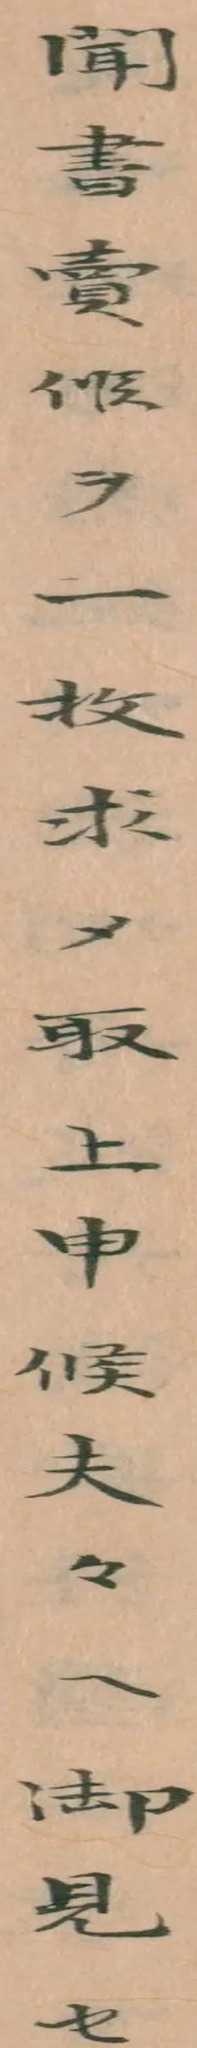聞書売候ヲ一枚求メ取上申候夫々へ御見せ
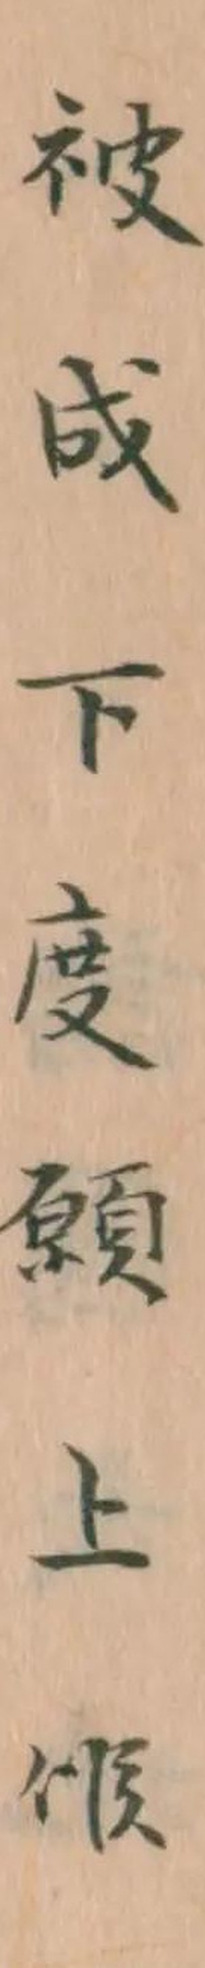被成下度願上候
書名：地災撮要. 巻1(噴火山・地震ノ部)
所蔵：国立国会図書館 National Diet Library, JAPAN
